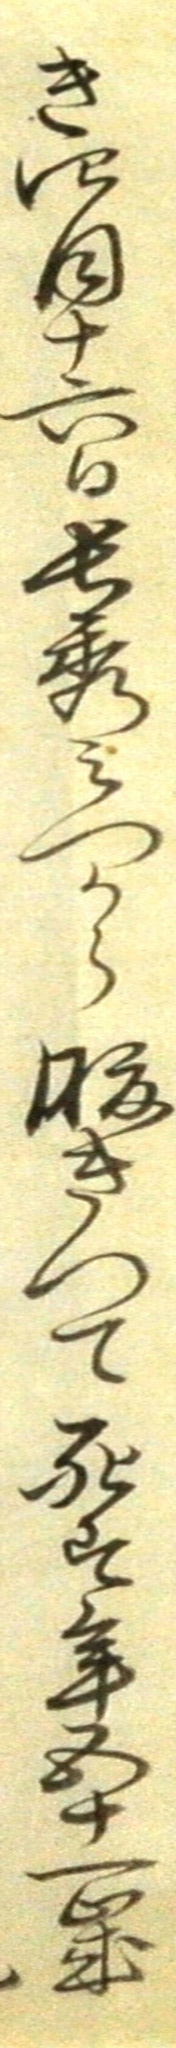き四月十六日長秀みつから腹きつて死す年五十一歳
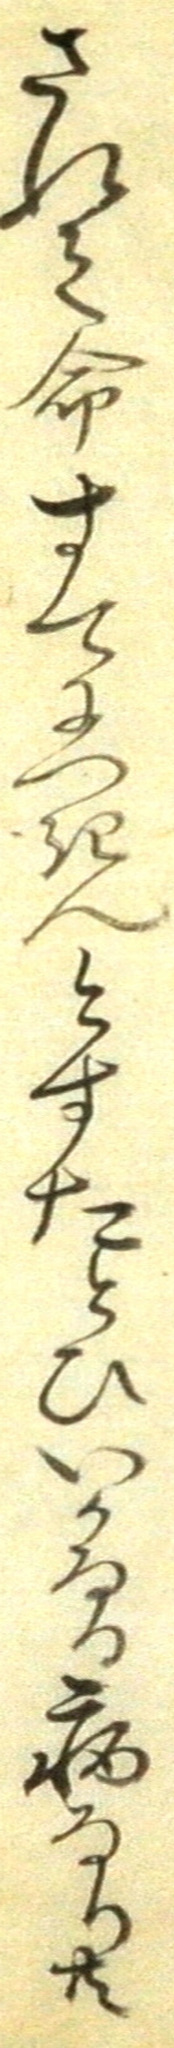されて命すてにつきんとすたとひいかなる病なり共
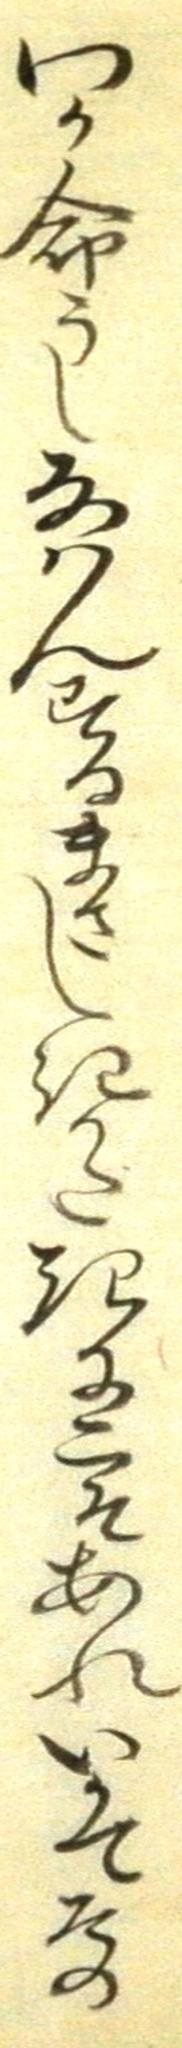わか命うしなはんするまさしきかたきにこそあれいかてその
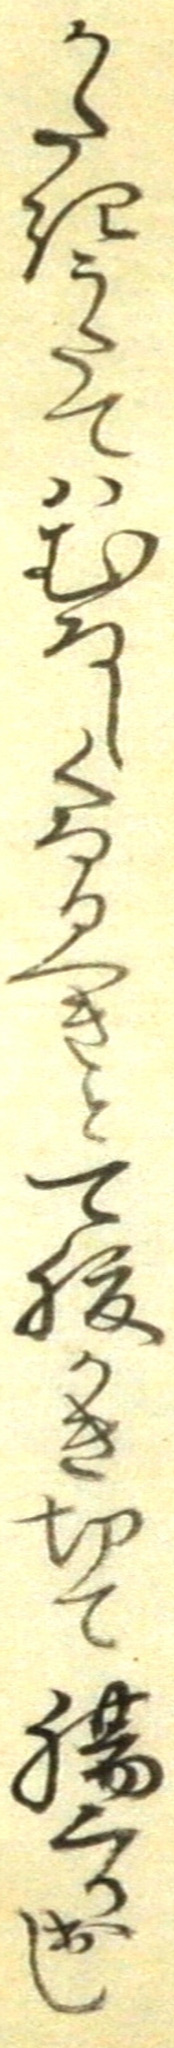かたきうたてはむなしくなるへきとて腹かき切て腸くり出し
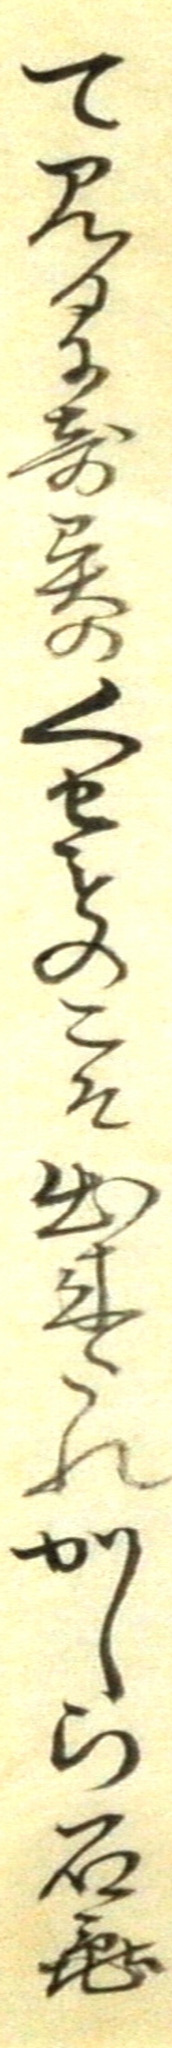て見るに奇異のくせものこそ出来たれかしら石亀
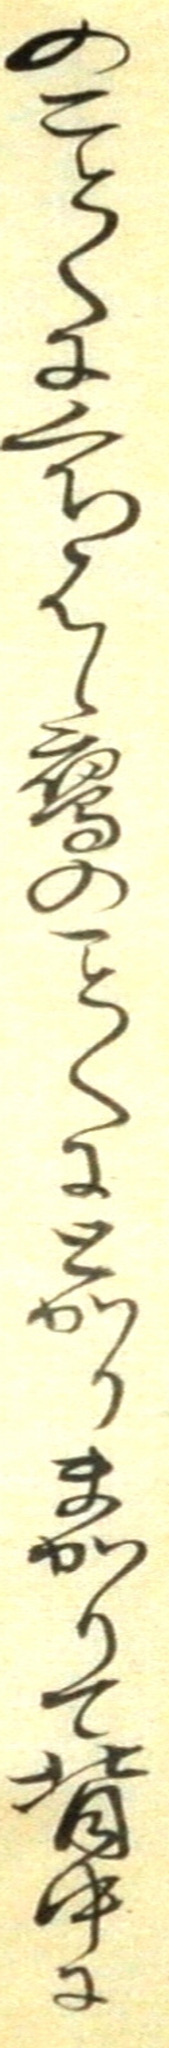のことくにくちはし鷹のことくにとかりまかりて背中に
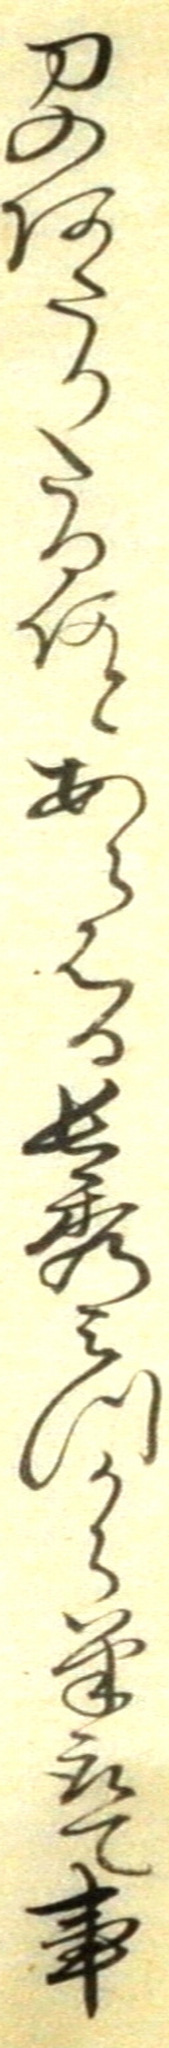刀のあたりたるあとあらはる長秀みつから筆取て事
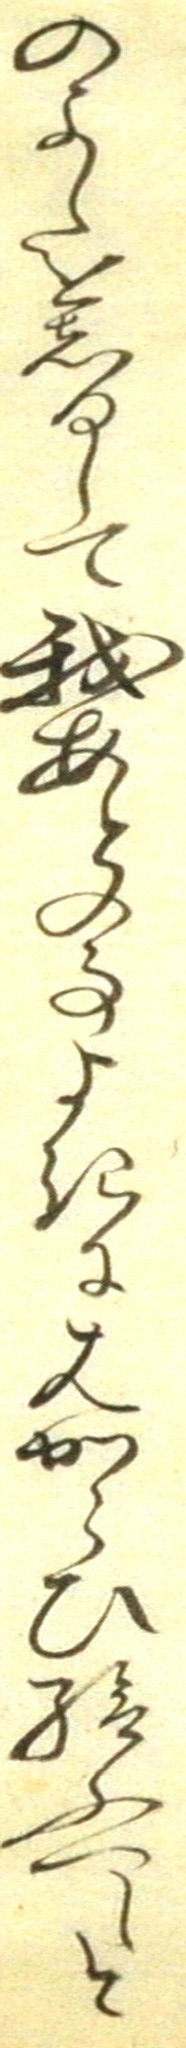のよしをしるして我あとの事よきにはからひ給ふへしと
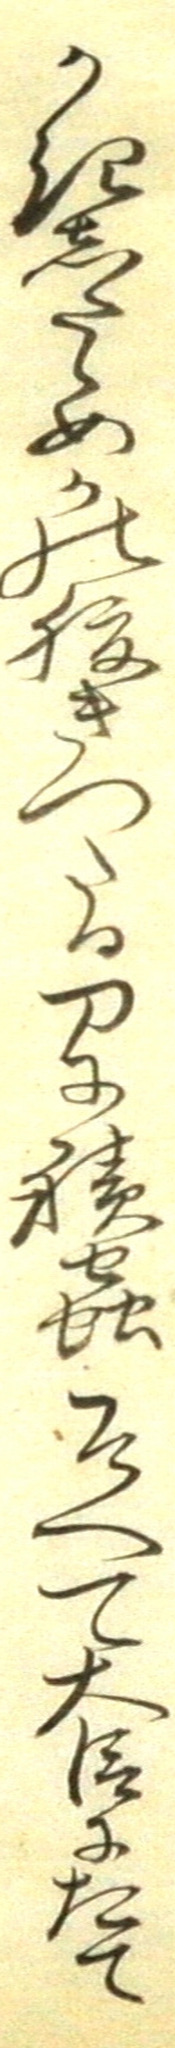かきしたゝめかの腹きつたる刀に積虫そへて大臣にたて
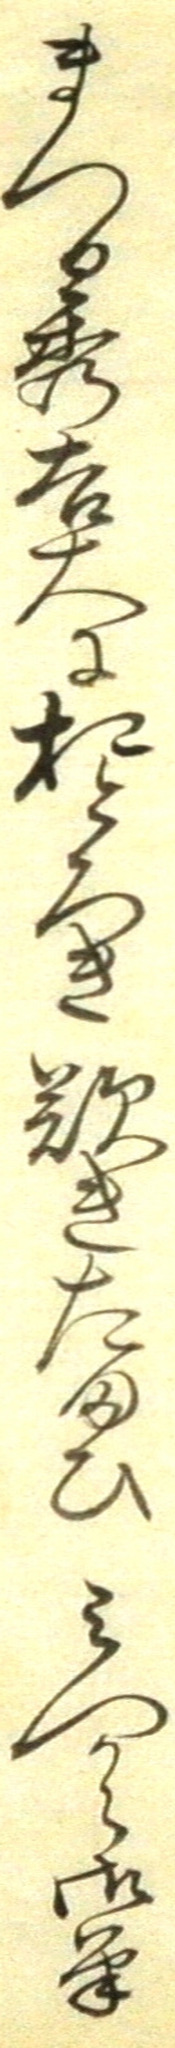まつる秀吉大におとろき歎きたまひみつから御筆
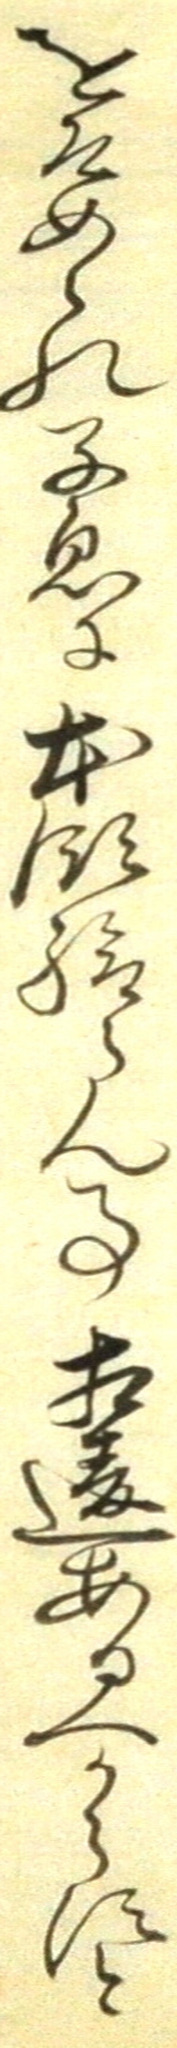をそめられ子息に本領給らん事相違あるへからすと
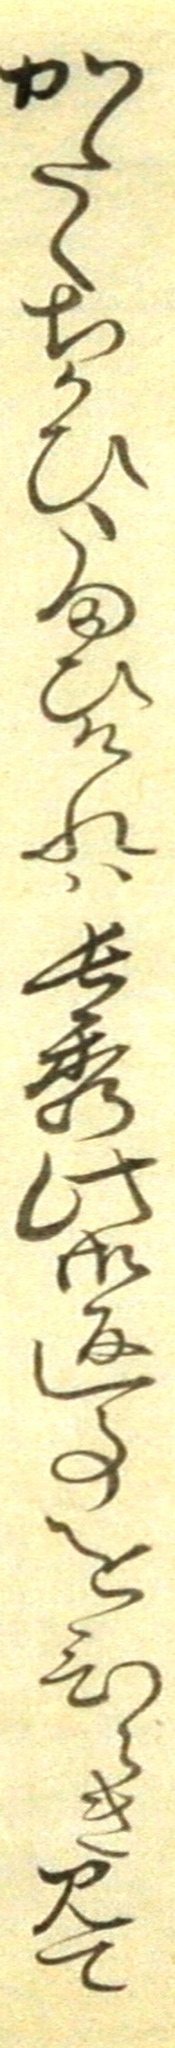かたくちかひたまひけれは長秀此返事をひらき見て

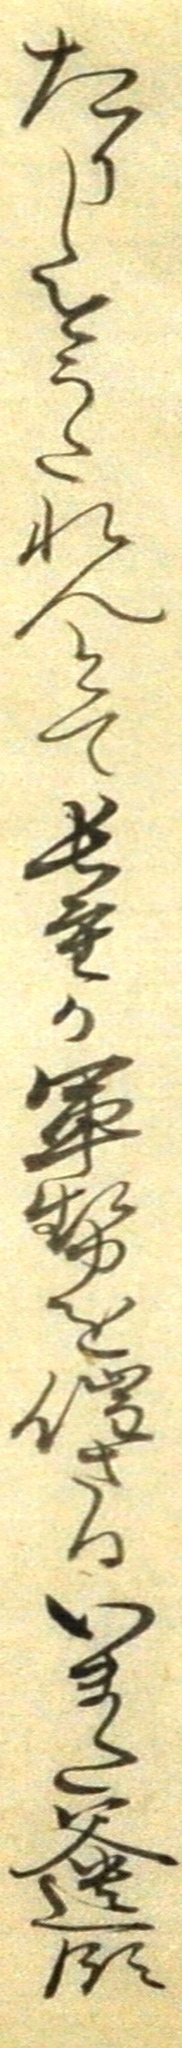たりしをうたれんとて長重か軍勢を催さるいまた父遺領
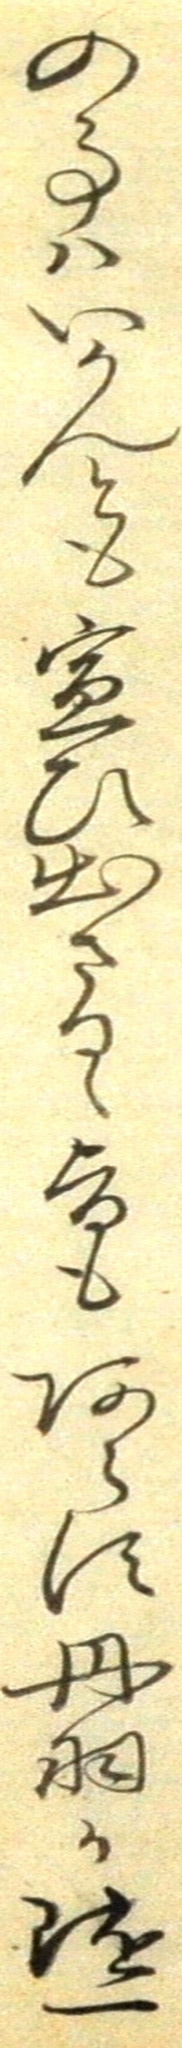の事はいかんとも宣ひ出さるゝ旨もあらす丹羽か随一
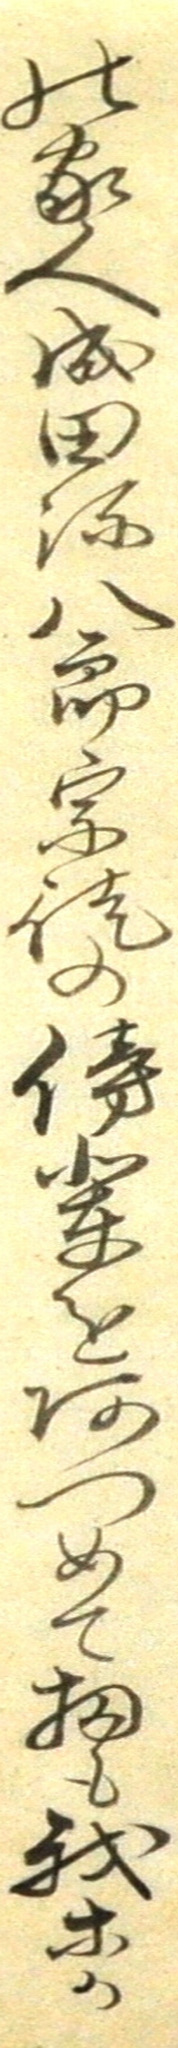の家人成田弥八郎宗徒の侍輩をあつめて扨も我等か
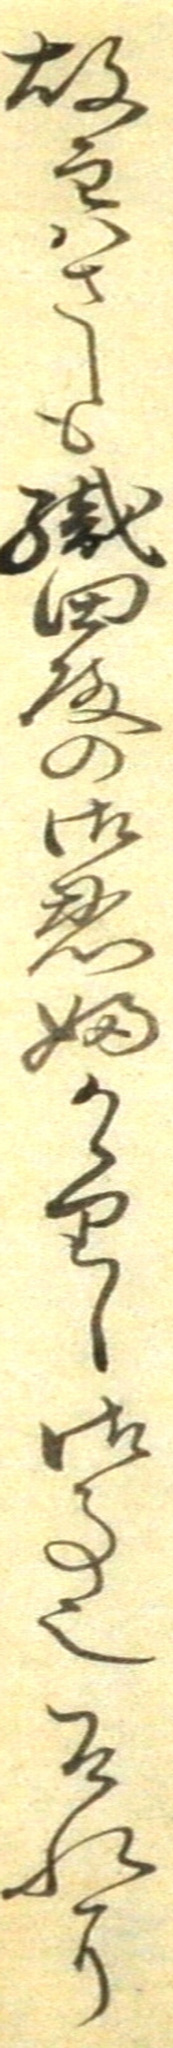故主はさしも織田殿の御恩ふかゝりし御事也それに
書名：藩翰譜（八・下）
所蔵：伊那市立高遠町図書館・合同会社AMANE
